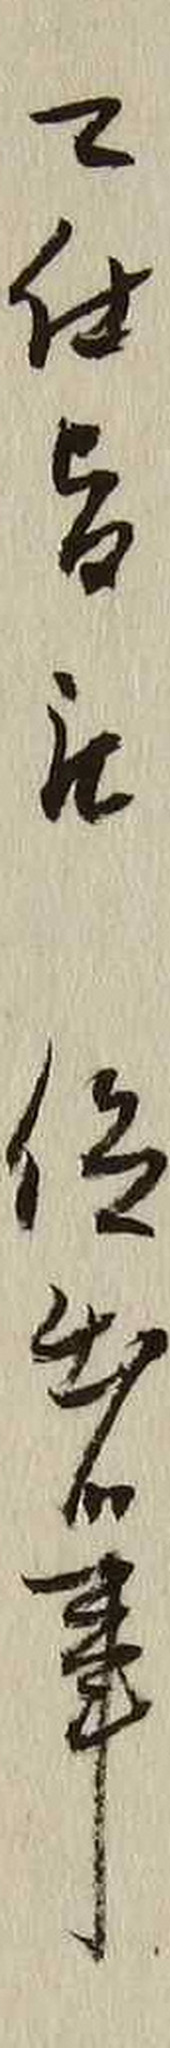可仕旨被仰出候事
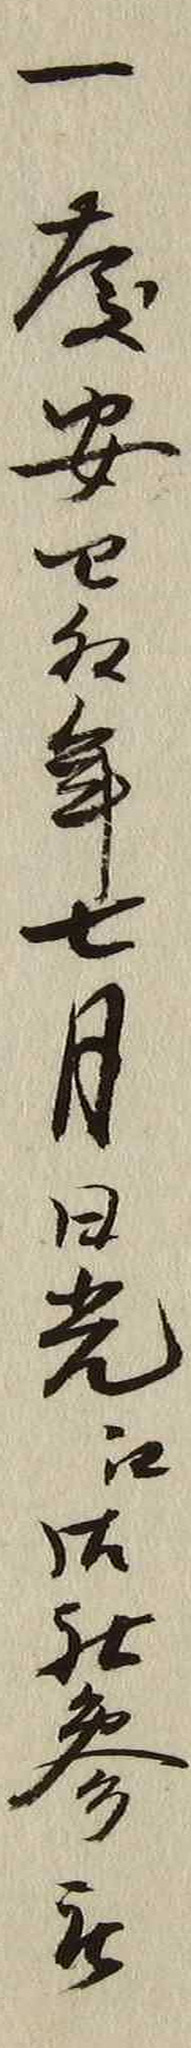一慶安四卯年七月日光江御社参被
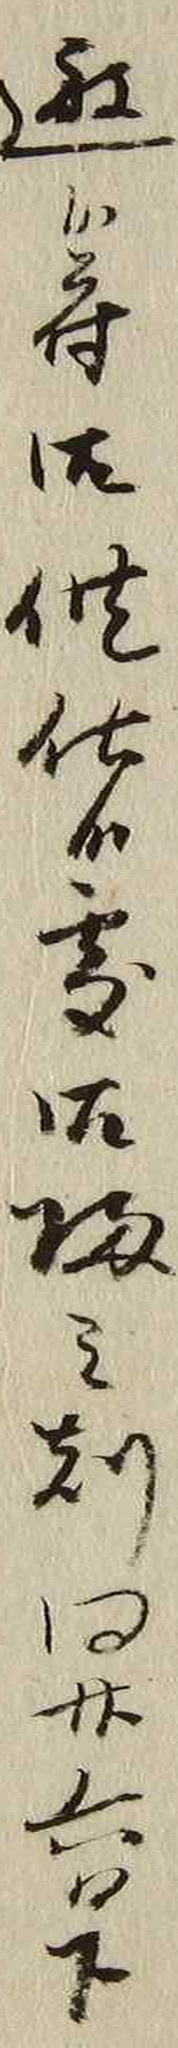遊候ニ付御供仕候処御帰之刻同廿六日下
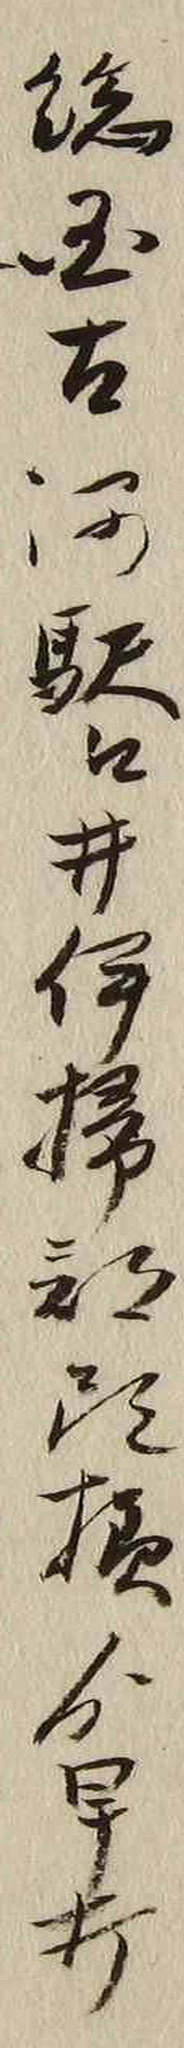総国古河駅江井伊掃部頭様ゟ早打
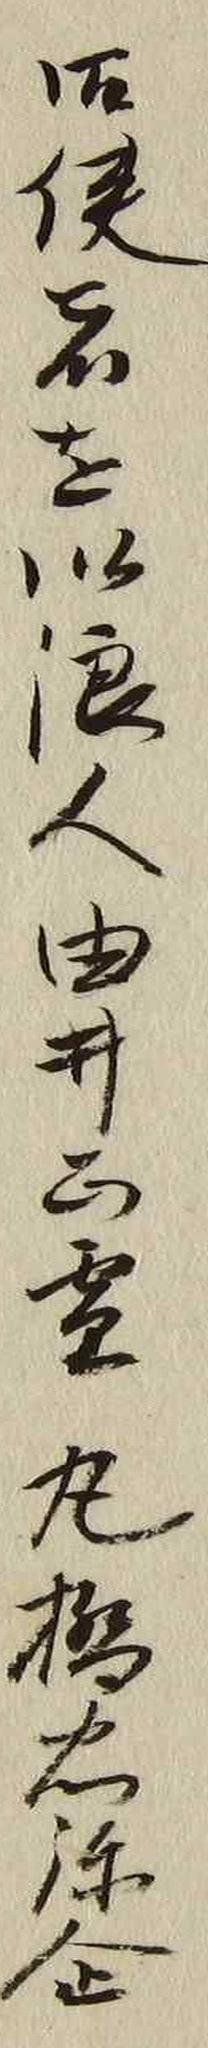御使者を以浪人由井正雪丸橋忠弥企
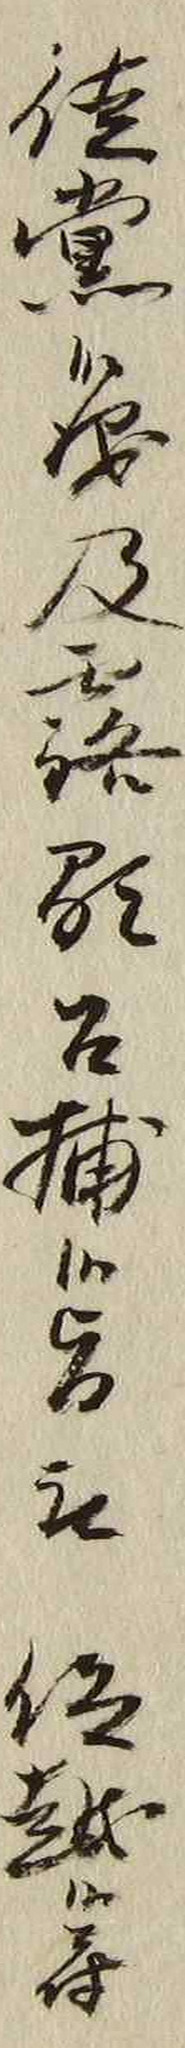徒党候儀及露顕召捕候旨被仰越候ニ付
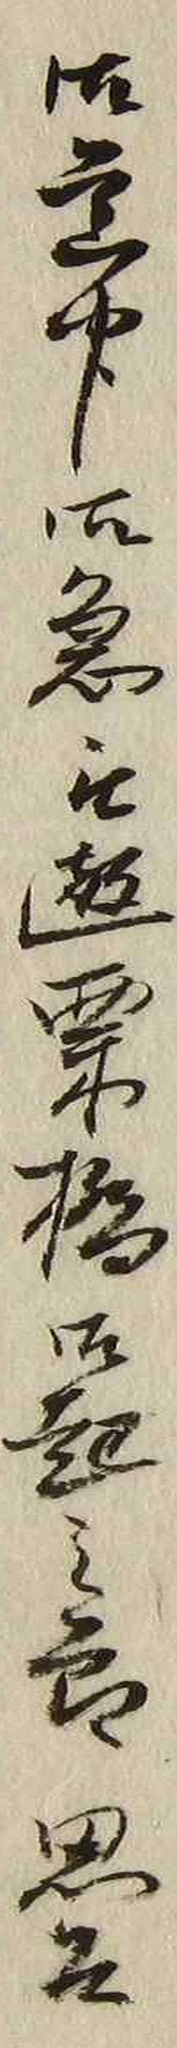御道中御急被遊栗橋御起之節思召
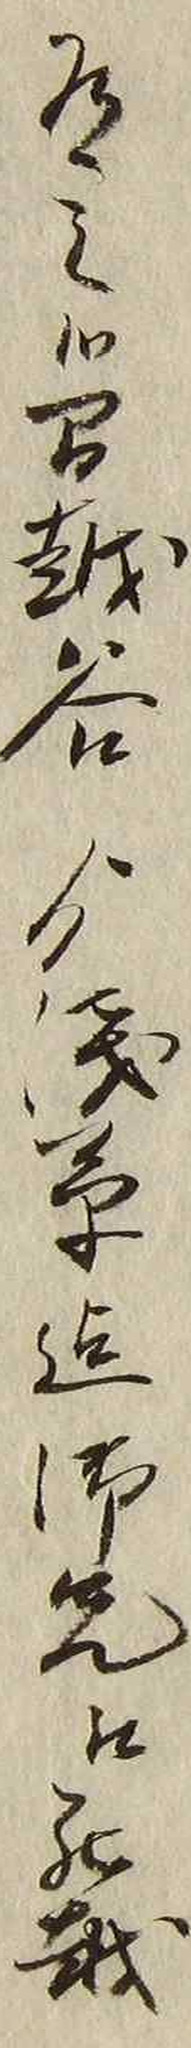有之候間越谷ゟ浅草迄御先江罷越
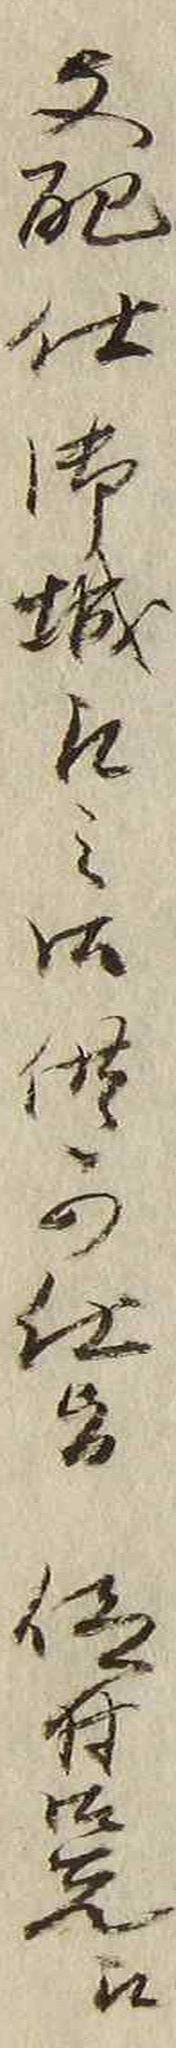支配仕御城江御供可仕旨仰付御先江

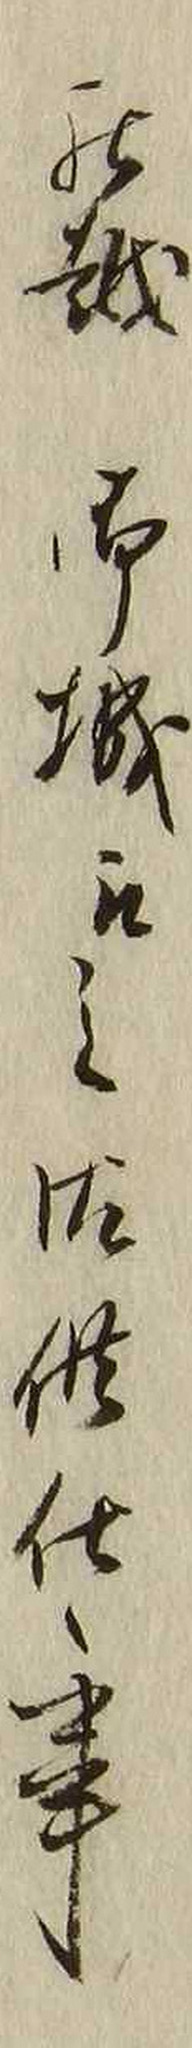罷越御城江之御供仕候事
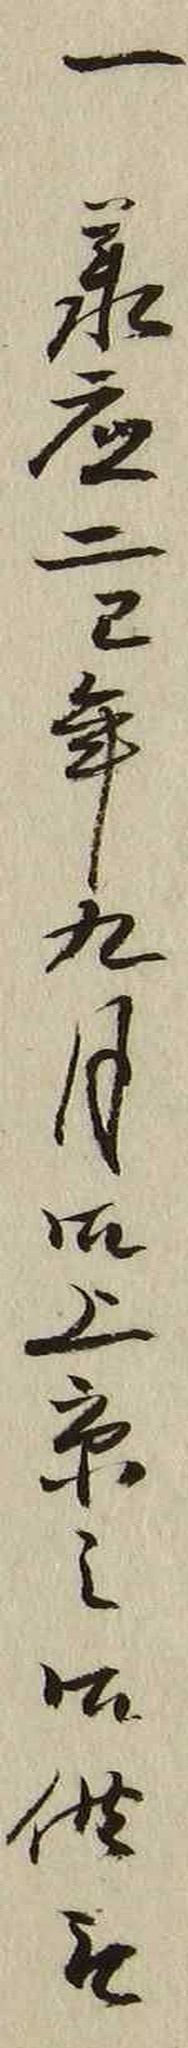一承応二巳年九月御上京之御供被
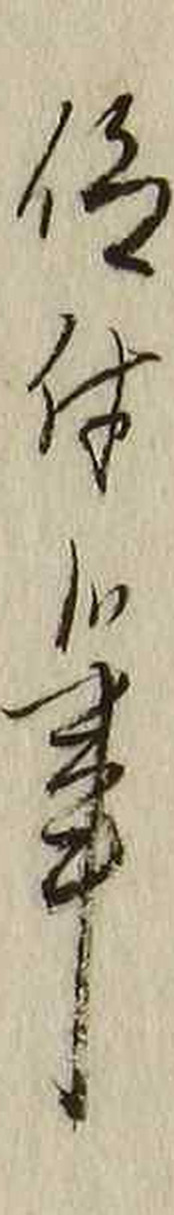仰付候事
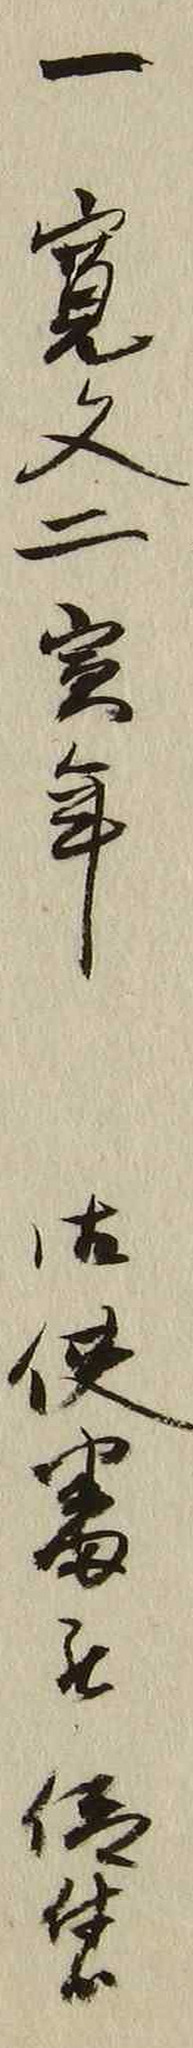一寛文二寅年御使番被仰付候
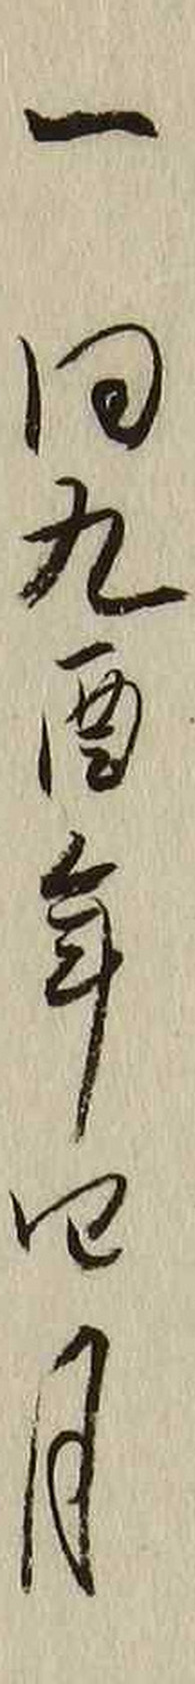一同九酉年四月
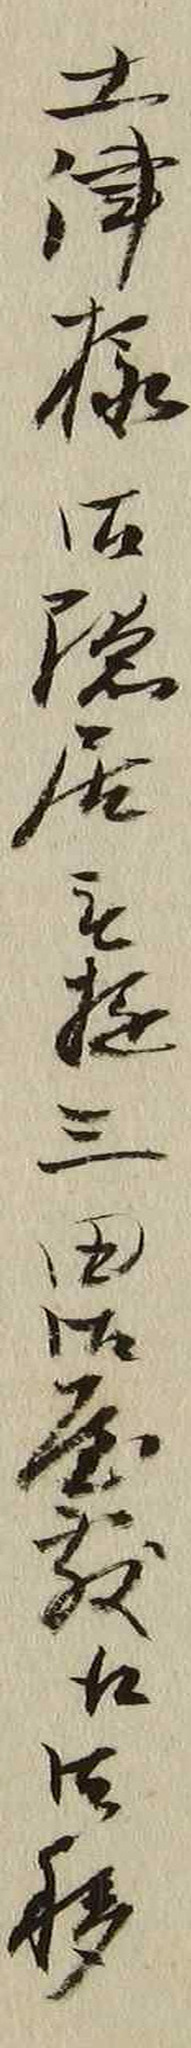土津様御隠居被遊三田御屋敷江御移
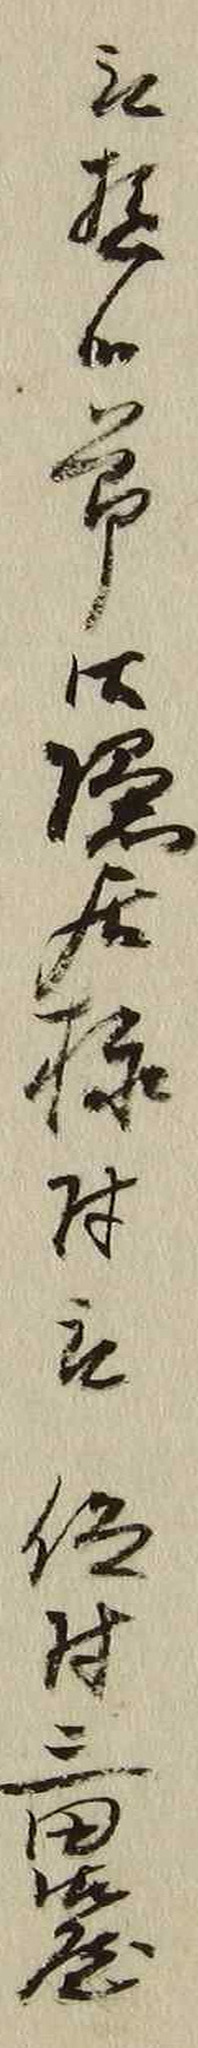被遊候節御隠居様付被仰付三田御屋
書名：諸士系譜　巻之345　も之部1
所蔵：会津若松市立会津図書館
